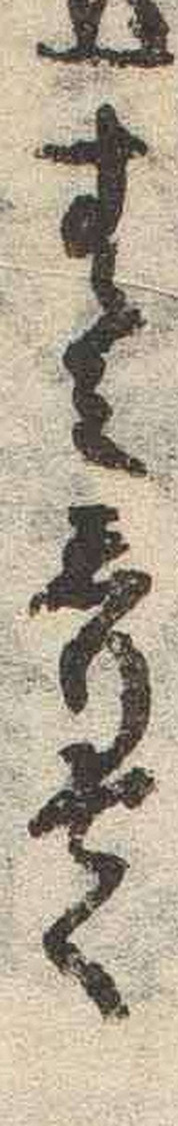進退すゝみしりそく
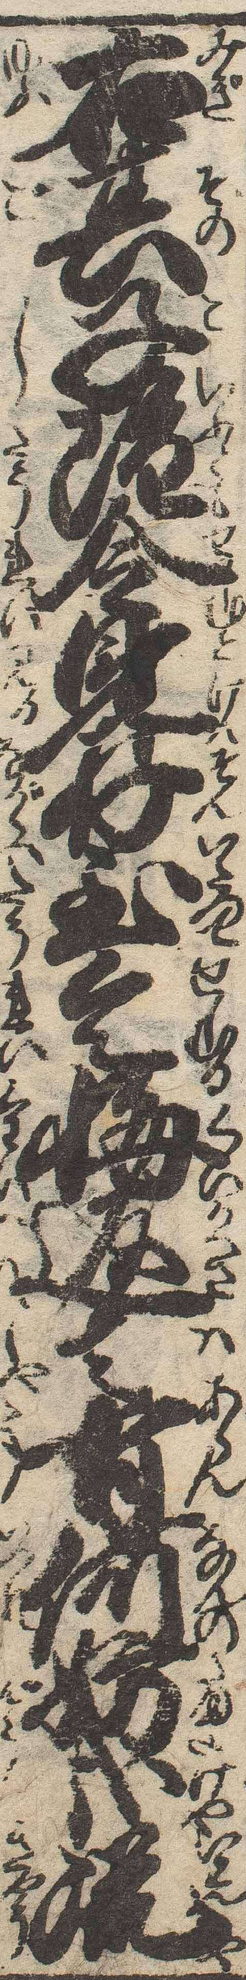右其子雖令見存至令悔返者有何妨哉况
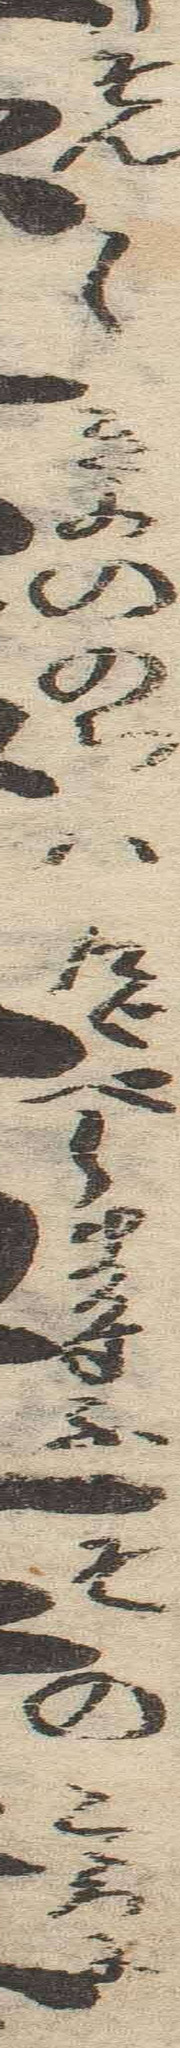しそんしきよののつはたゞべしまかすふそのこころ
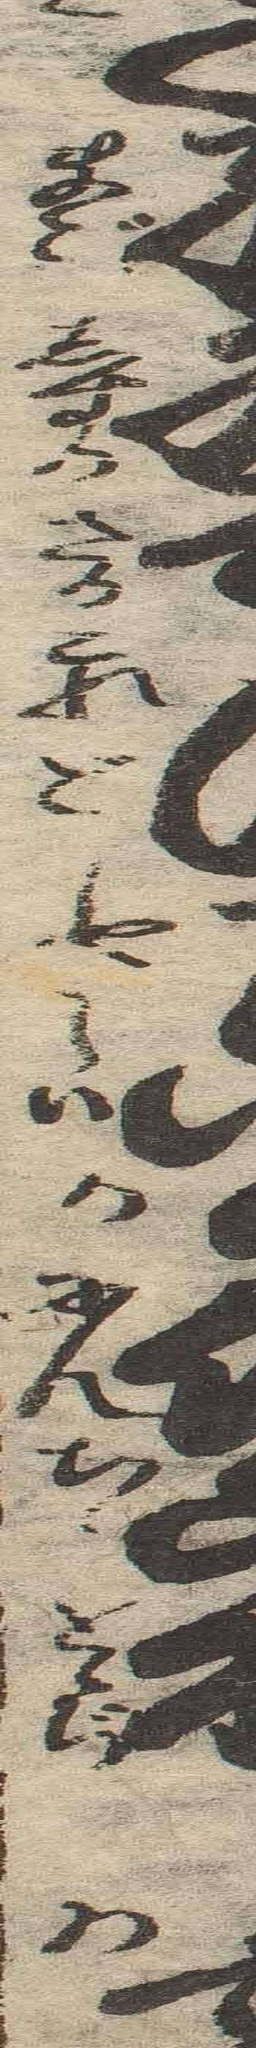こまごしするさるこれごしやしいかにんちゝをゝぢゐ

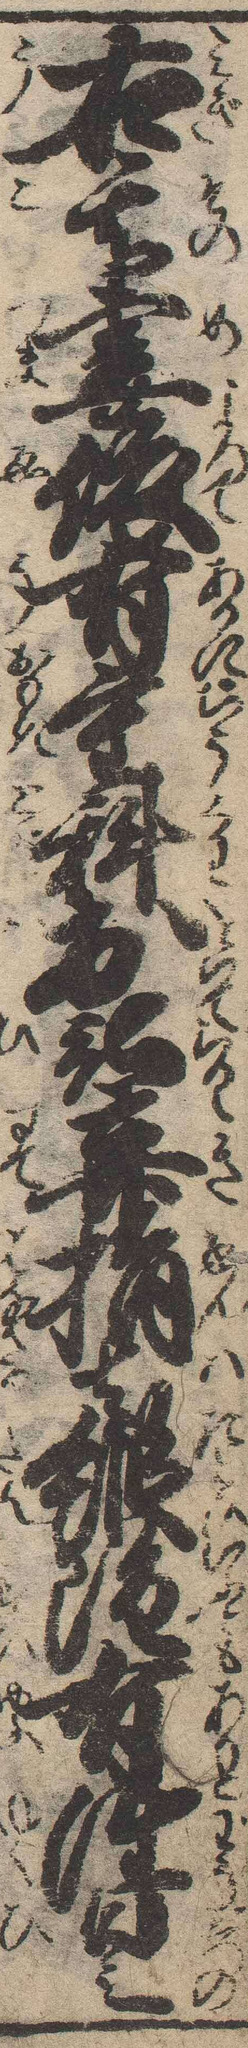右其妻依有重科於被弃捐者縦雖有往日之
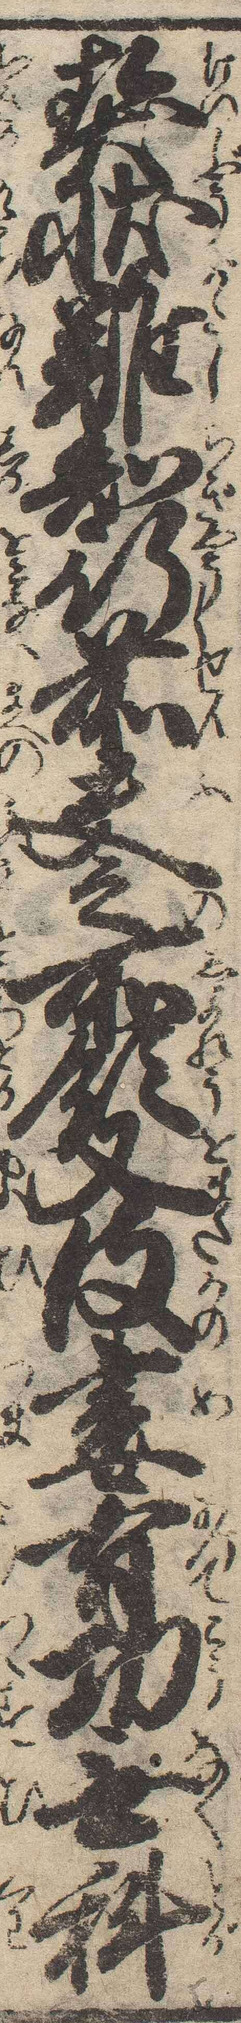契状難知行前夫之所領彼妻功無科
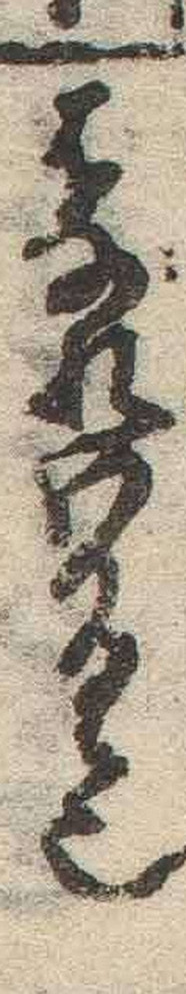離別はなれわかるゝ也
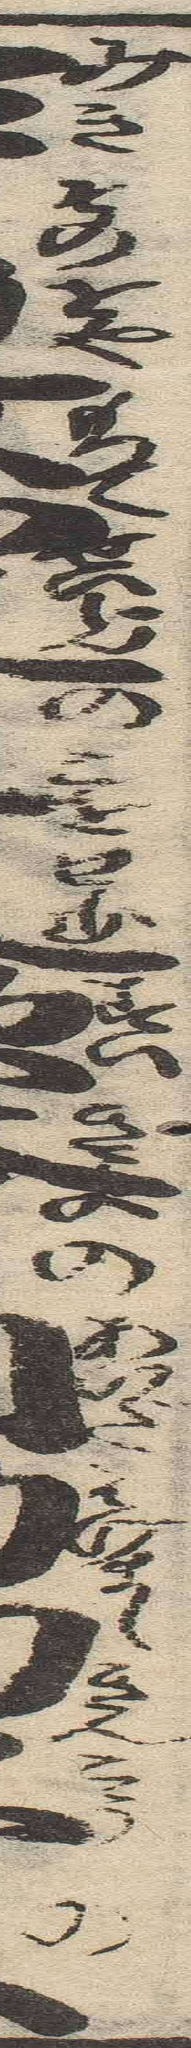みきそのをやもつてせいじんのこをせしむすいきよのあいだはけましきんこうの
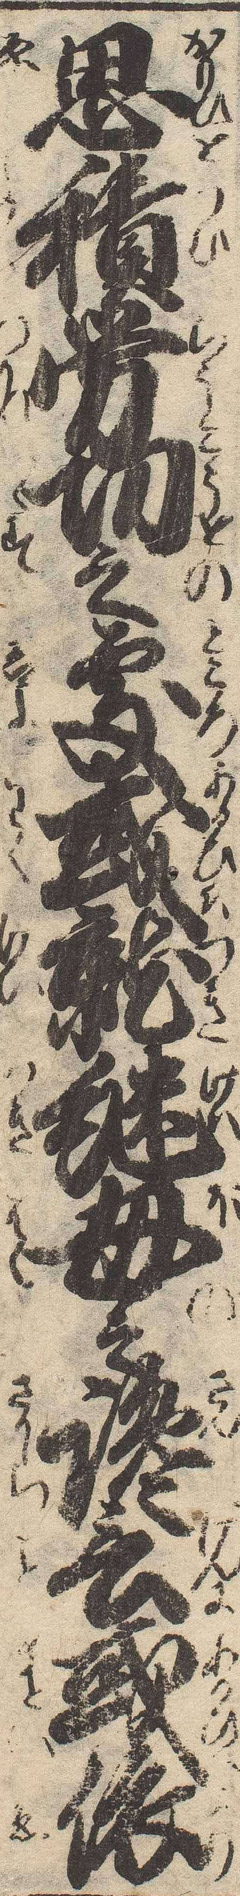思積労功之處或就継母之讒言或依
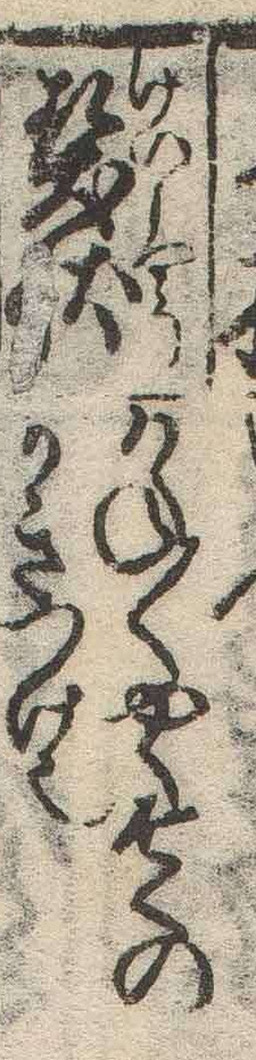契状かねくやくそくの
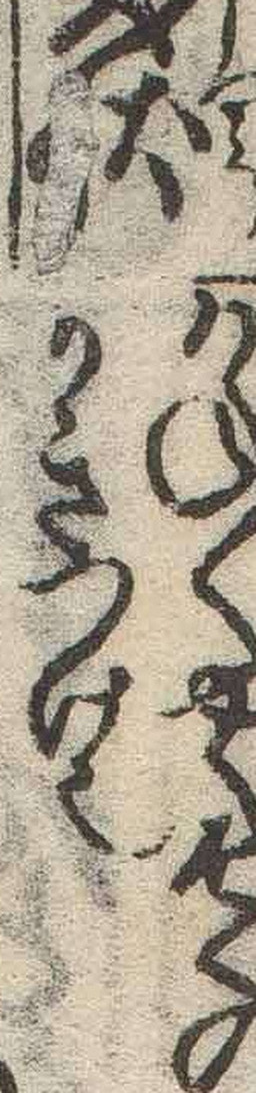かきつけ也
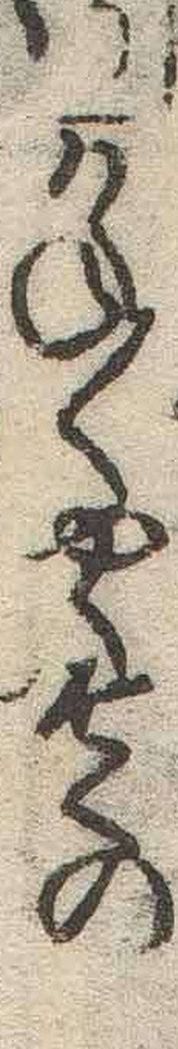契状かねくやくそくの
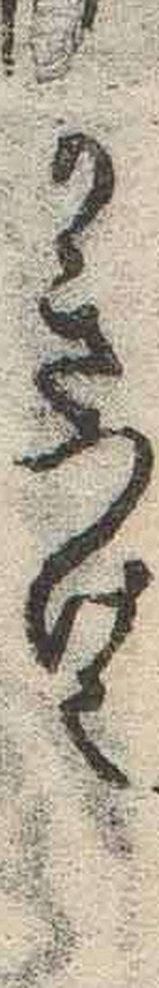かきつけ也
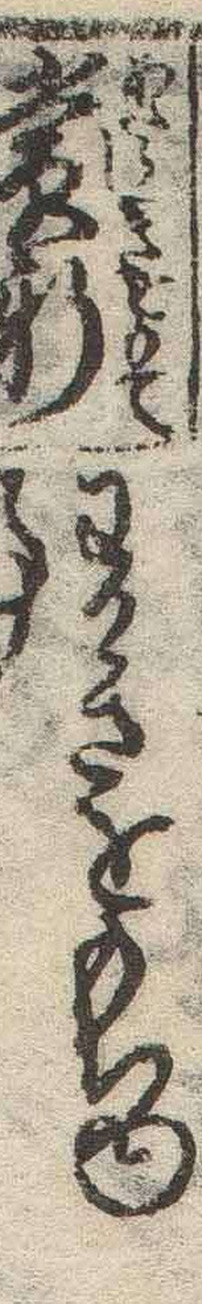賞新わかきをもちゆ
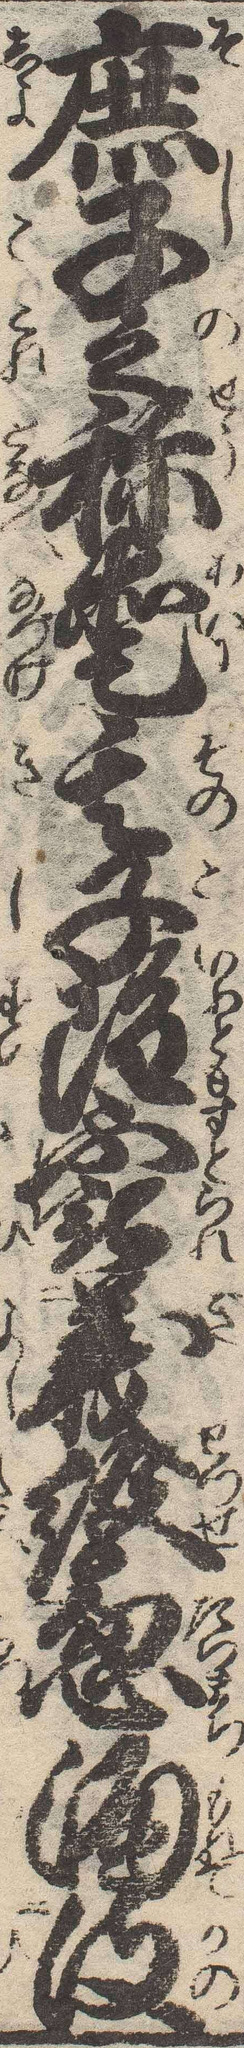庶子之称愛其子雖不被義絶忽漏彼
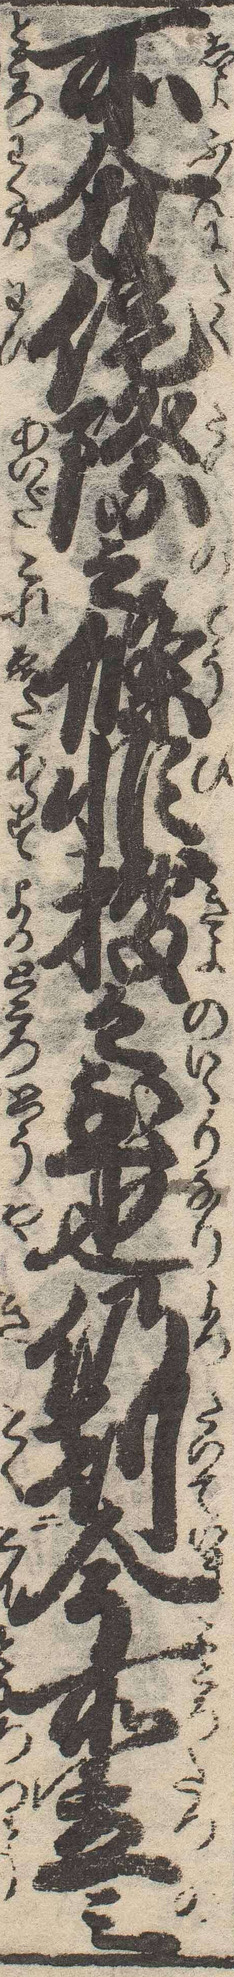所分侘際之條非據之至也仍割今所立之
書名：御成敗式目絵抄
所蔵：東京学芸大学附属図書館 国文学研究資料館
